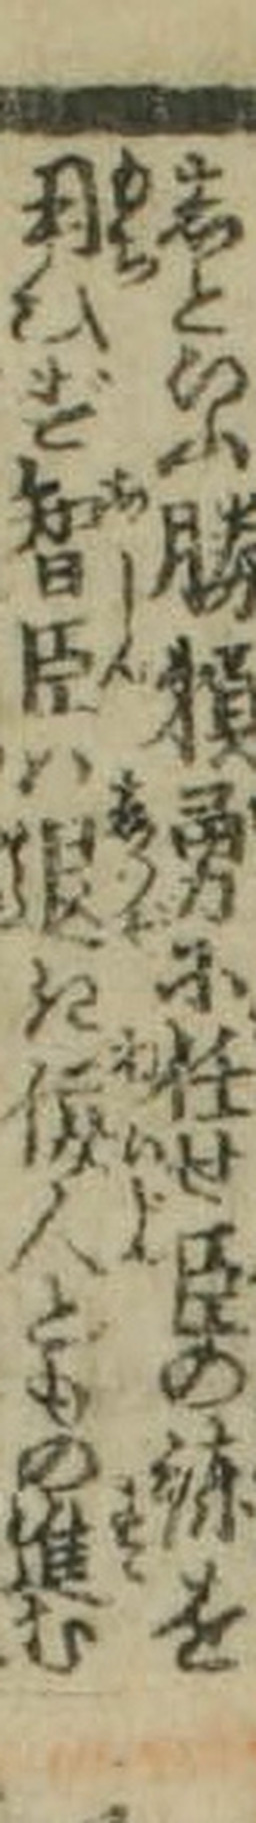用ひず智臣は退き佞人どもの進む
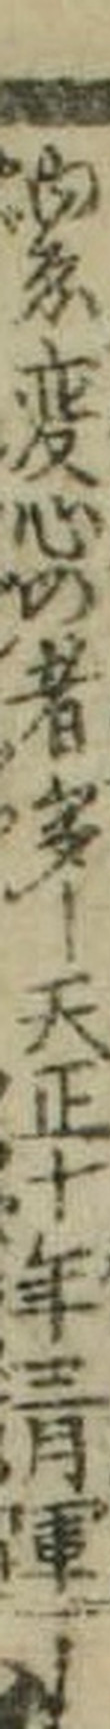ゆゑ変心の者多し天正十年三月軍
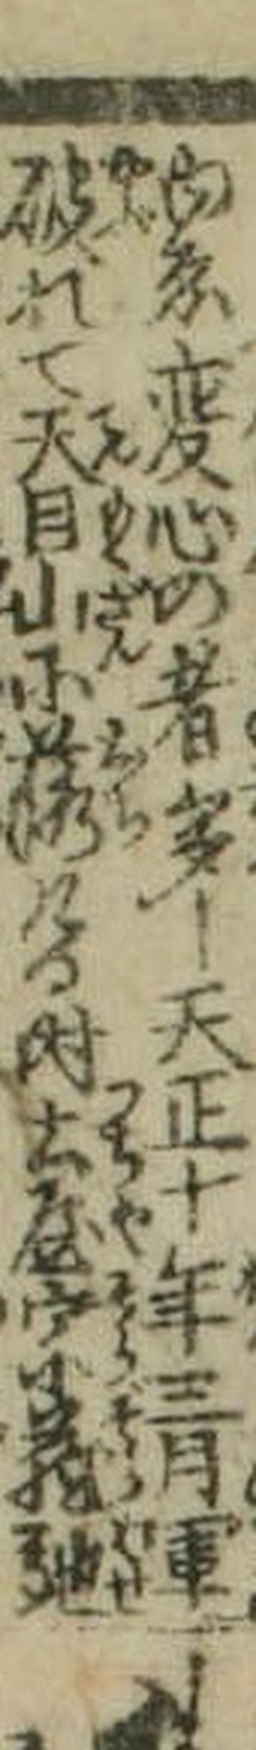破れて天目山に落ける時土屋宗蔵馳
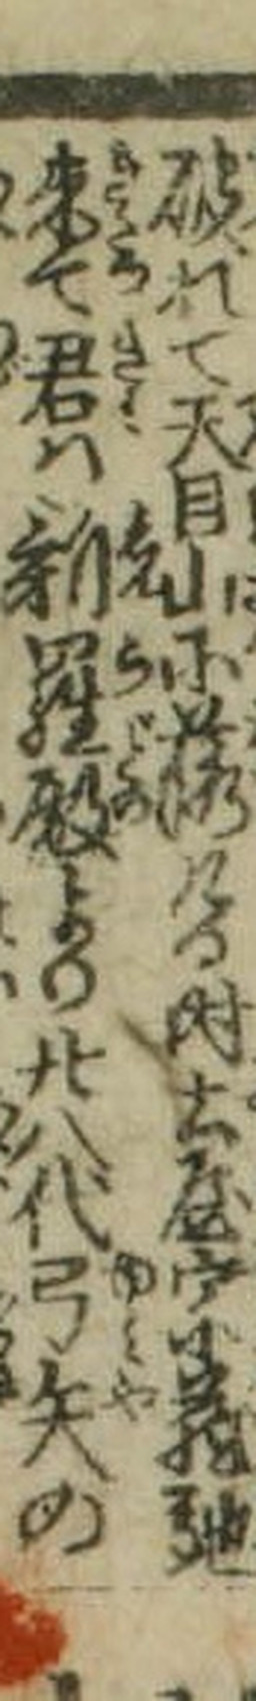来て君は新羅殿より廿八代弓矢の
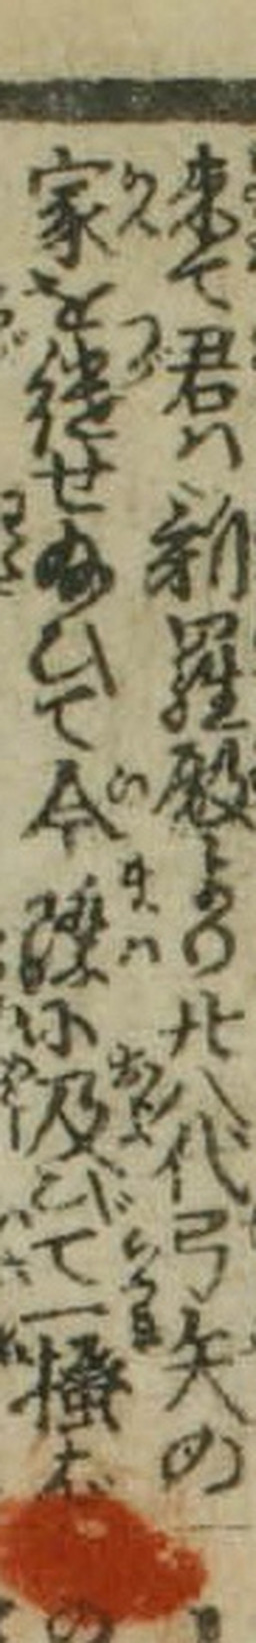家を継せ給ひて今際に及びて一揆ば
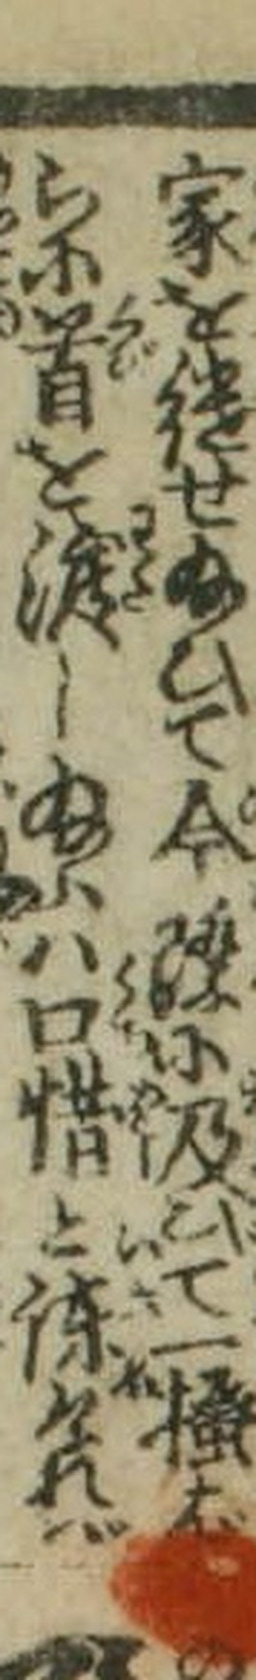らに首を渡し給ふは口惜と諌ければ
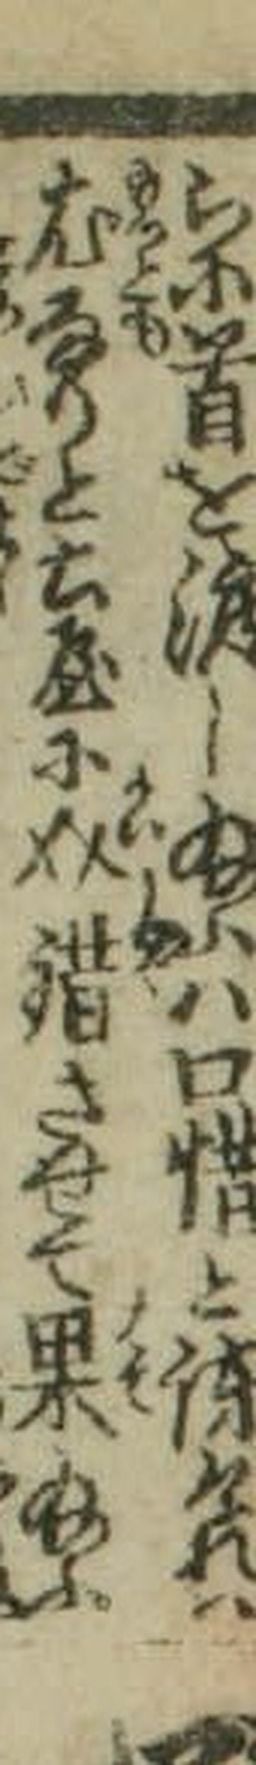尤なりと土屋に介錯させて果給ふ
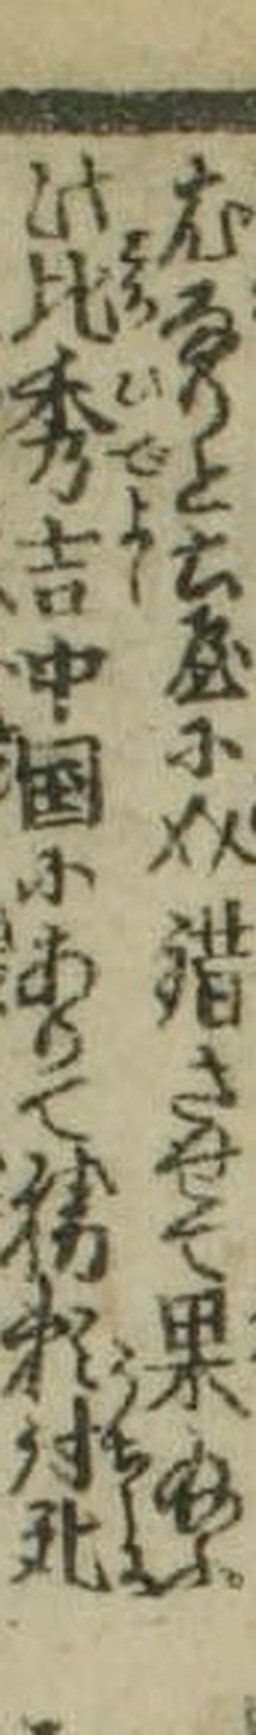此比秀吉中国にありて勝頼討死
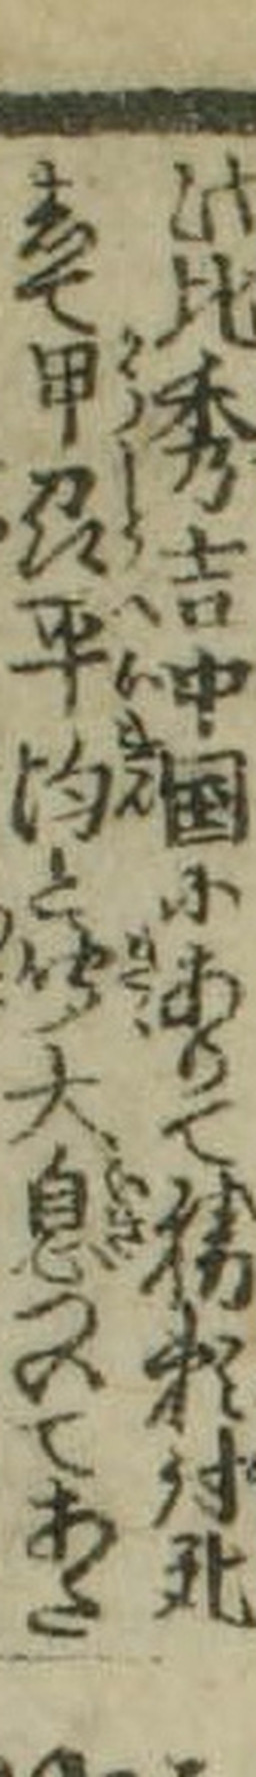して甲州平均と聞大息ついてあた
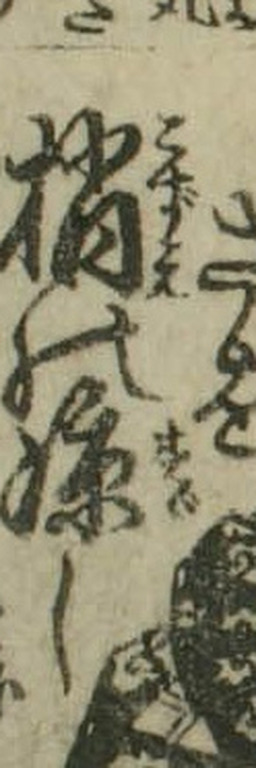梢の涼し
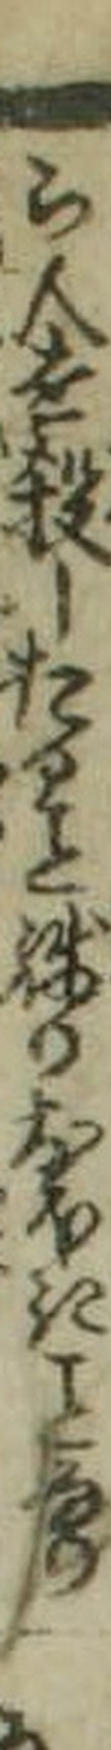ら人を殺したること残りおほきことなり
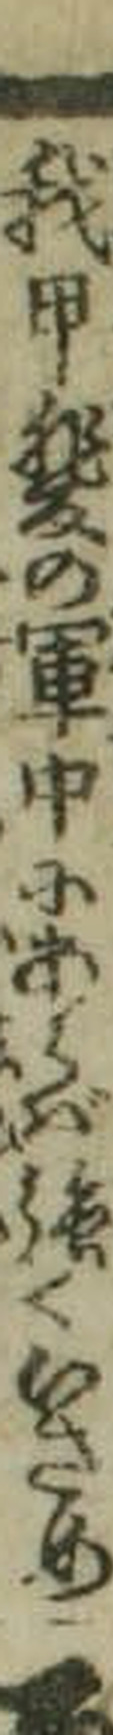我甲斐の軍中にあらば強くいさめ
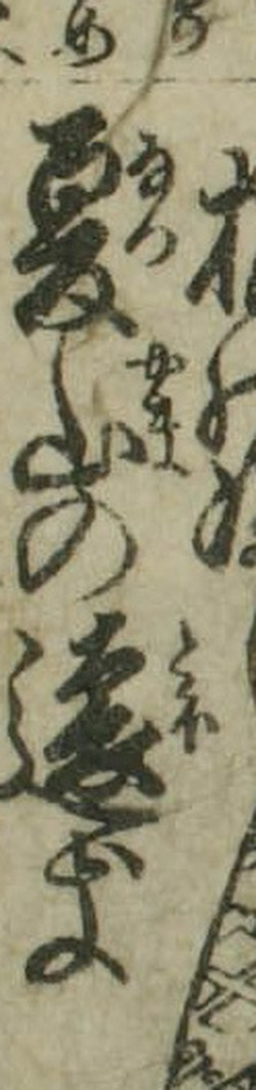夏山の遠き
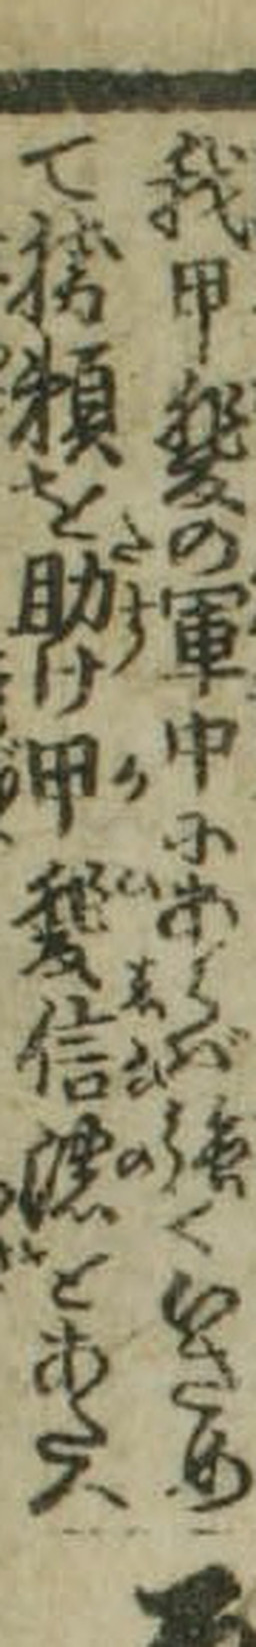て勝頼を助け甲斐信濃をあたへ
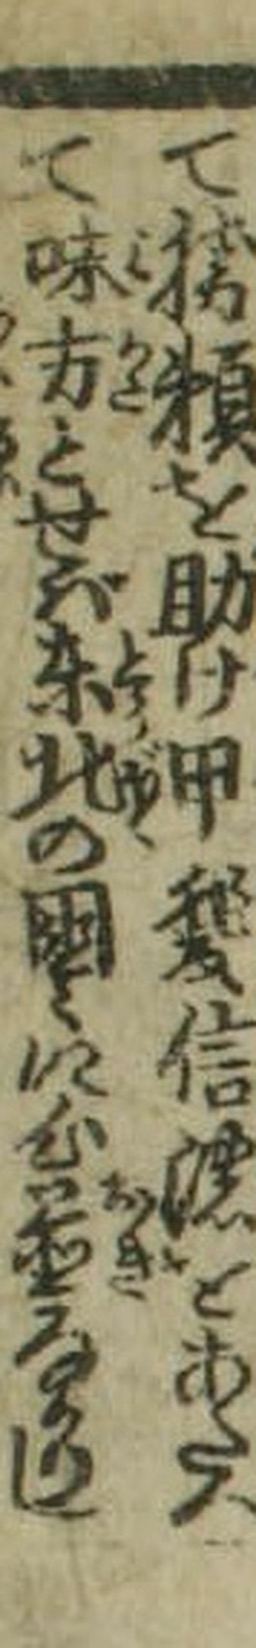て味方とせば東北の国々に心置なかりし
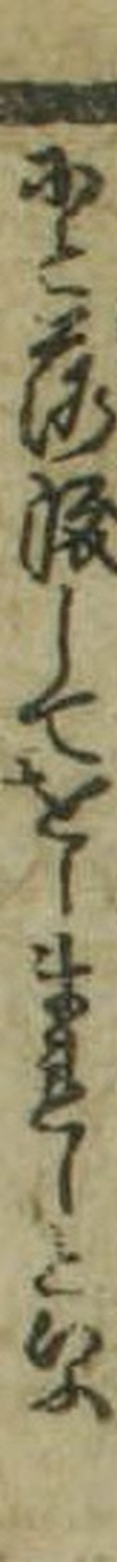にと落涙してをしまれしといふ
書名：續英雄百人一首
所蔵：東京学芸大学附属図書館
